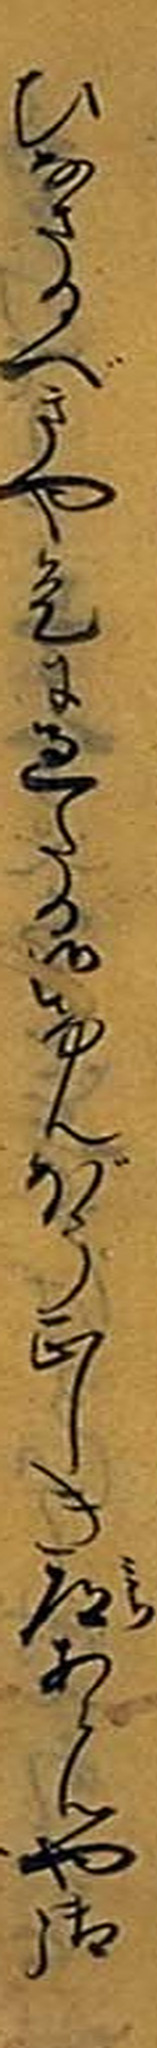ひなさるべきや是に過たる御けんぼう正しき道あらんや御

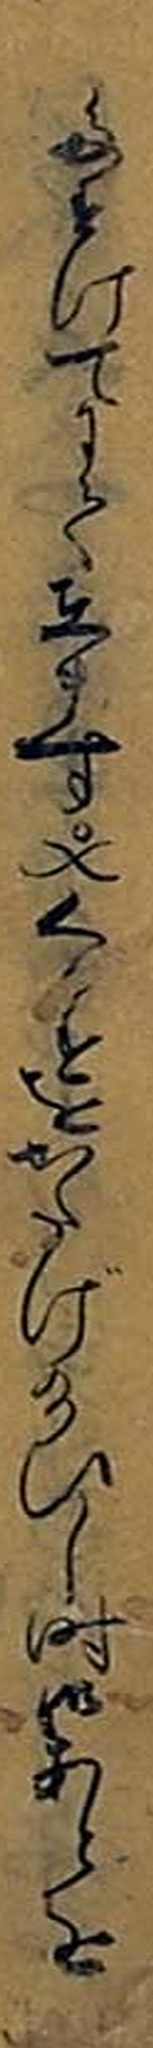たすけてにて在ます◦✕くすをかたげ給ひし時御あとを
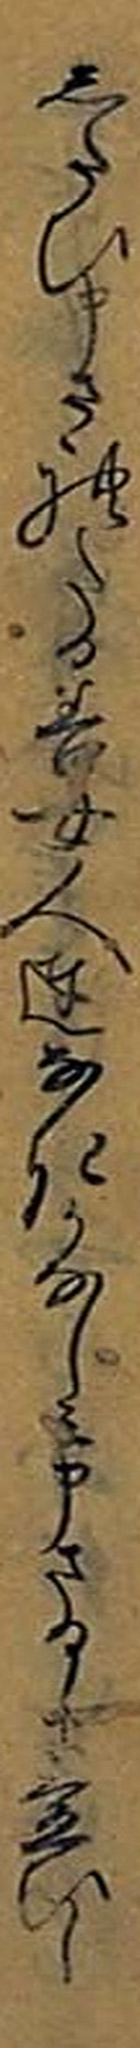したひ申されたる善女人達なきかなしみ申さるゝ宣ひし
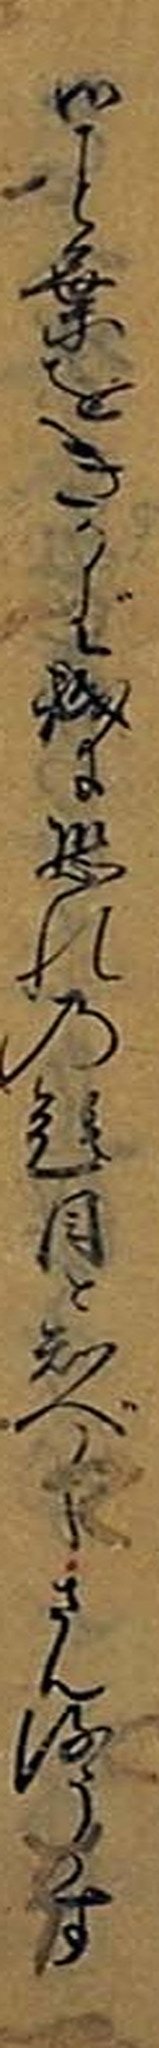御こと葉をきかば誠に恐れの題目と知べしさんるうかす
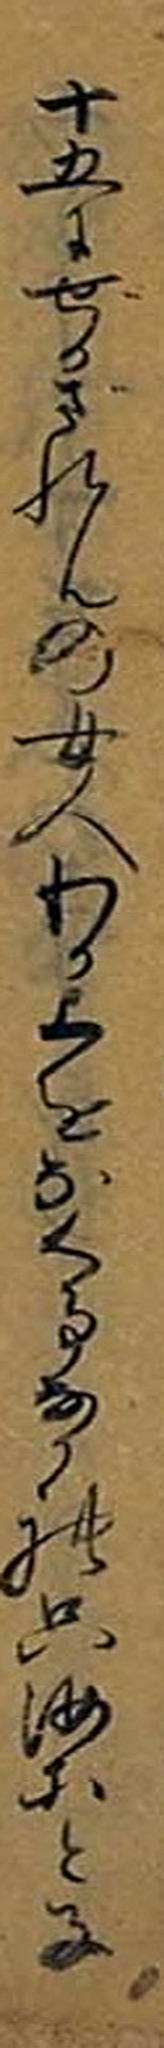十五にぜるざれんの女人わか上をなく事なかれ只汝等と子
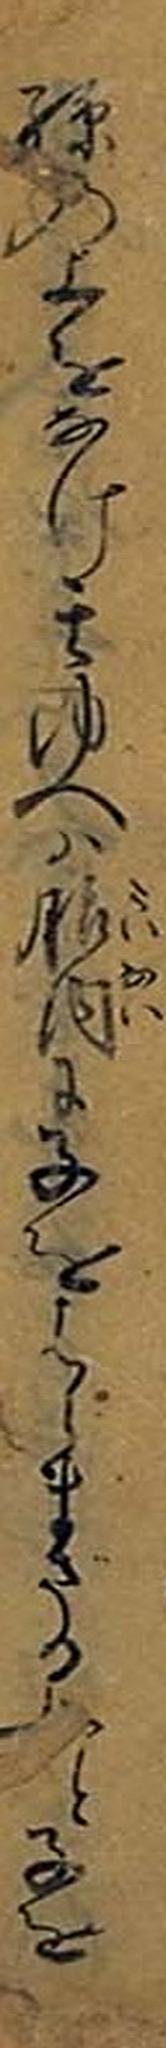孫の上をなけ其ゆへは胎内に子をはらまざると子を
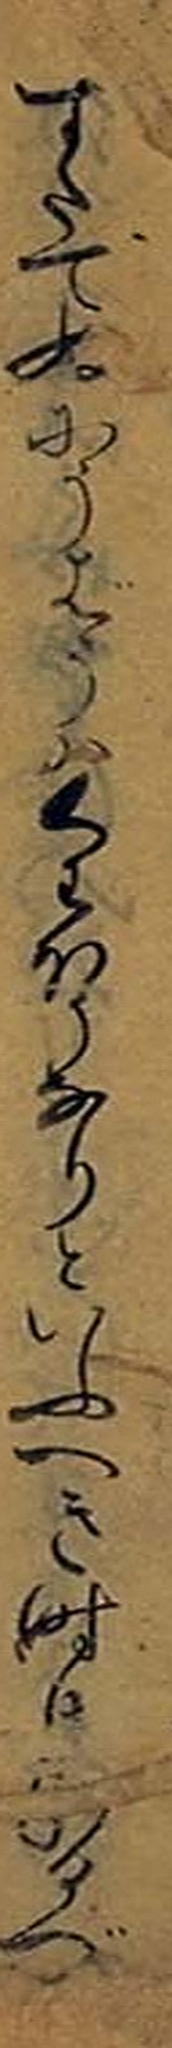すたてぬにうばうはくわほうなりといふへき時日るべ
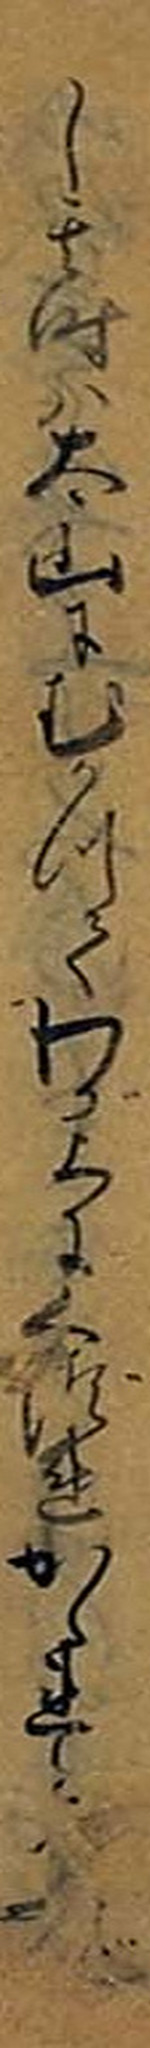し其時は太山にむかつてわが上にくづれかゝれ
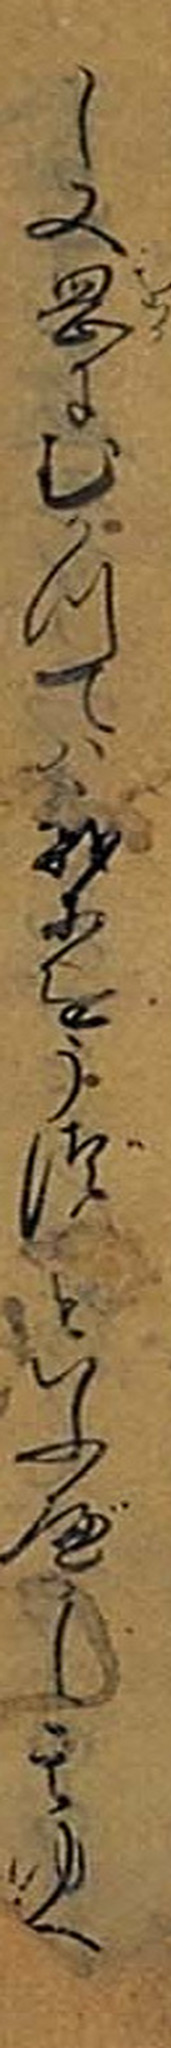し又岡にむかつては我等をうづといふべし其ゆへ
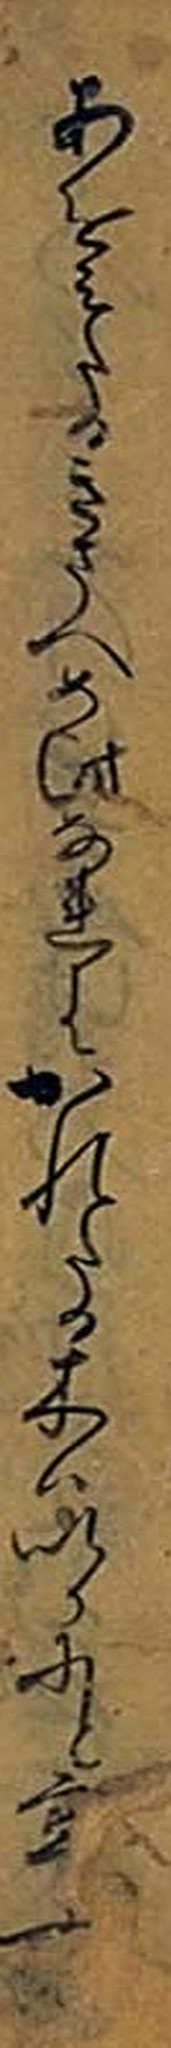あをみたるきさへ如此なれはかれたる木はいかにと宣
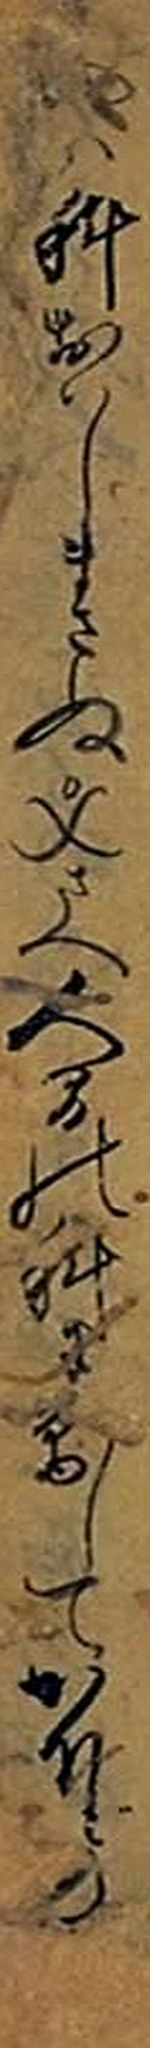は科おはしまさぬ◦✕さへ人間の科に対してかほど
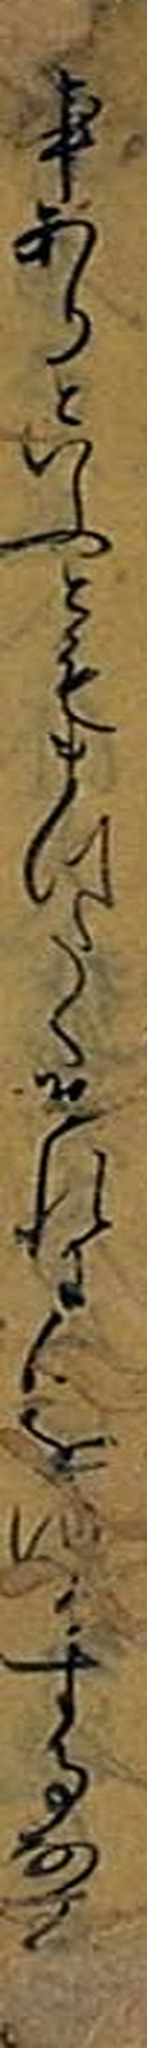事ありといふともまつたくそれにをゆるす事な
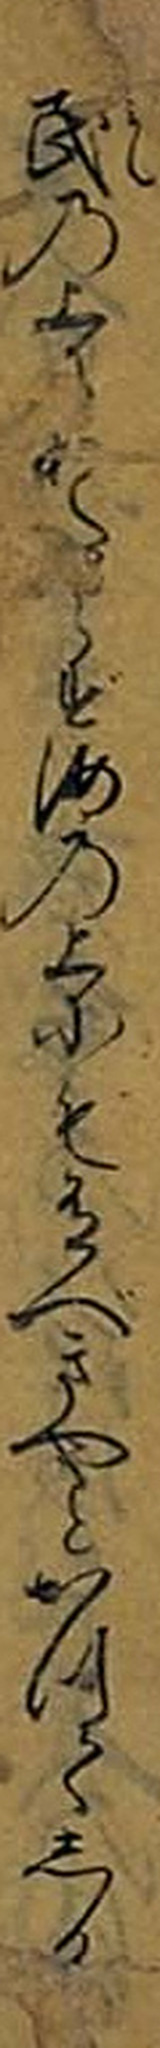民の上らず汝の上のも有べきやとかつてしる
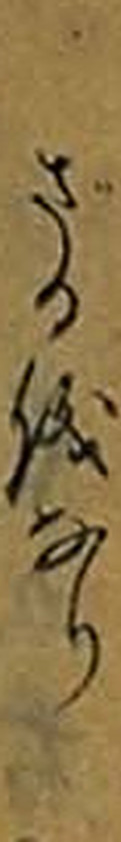ざる儀なり
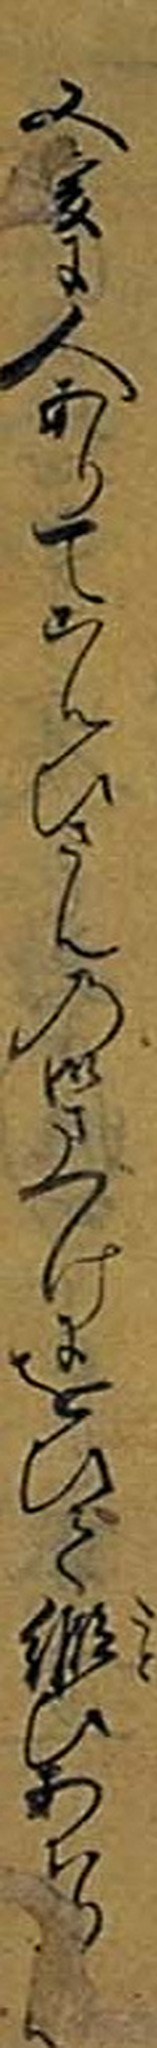又爰に人ありてこんひさんの御さづけにをひて縦ひあ
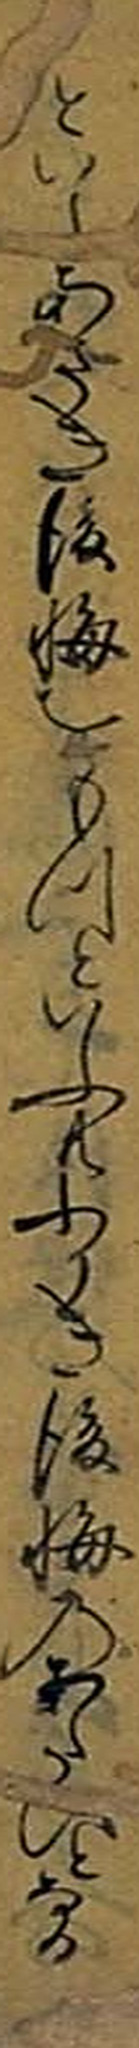といあさき後悔をもつといふ共ふかき後悔のあたいとなる
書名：ぎやどぺかどる
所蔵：東京大学総合図書館 / General Library in the University of Tokyo
